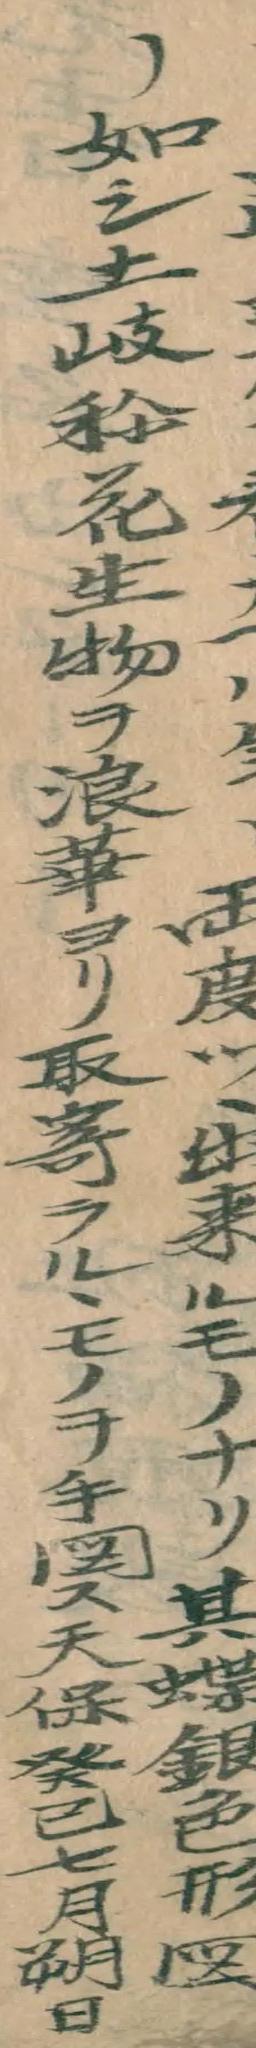ノ如シ土岐花生物ヲ浪華ヨリ取寄ラルヽモノヲ手図ス天保癸巳七月朔日

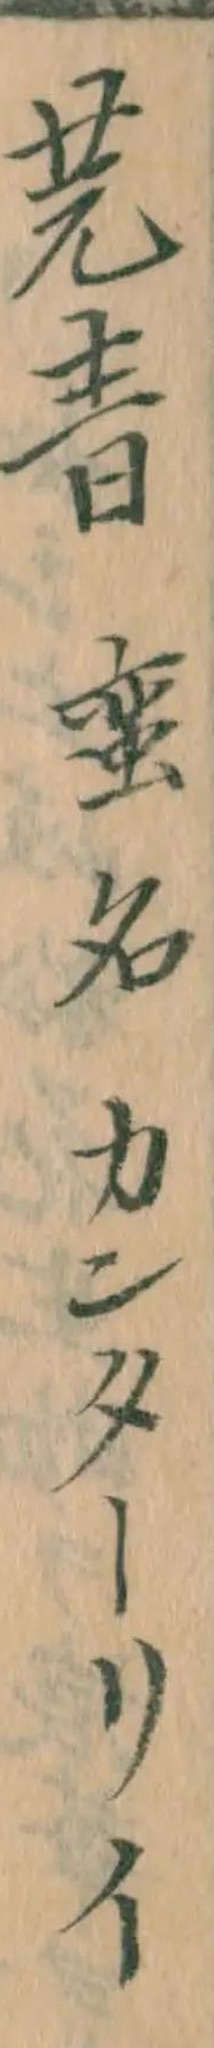芫青蛮名カンターリイ
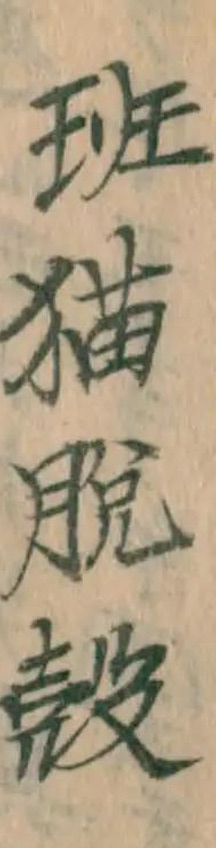班猫脱殻
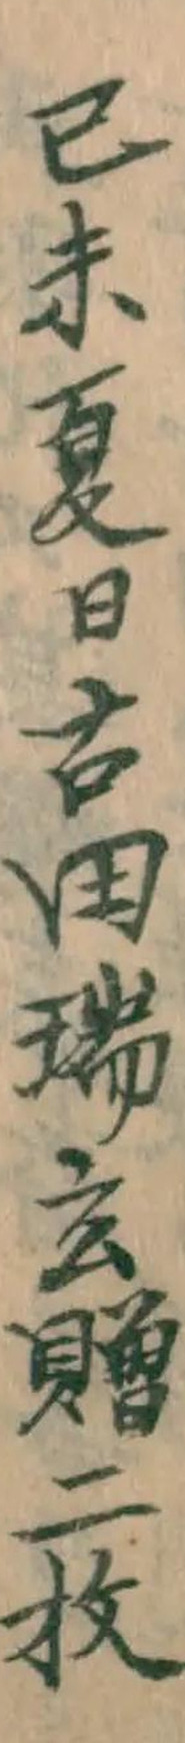己未夏日古田瑞玄贈二枚
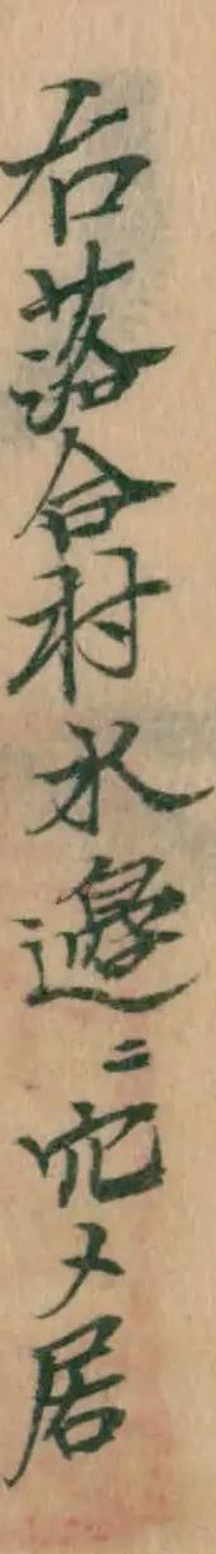右落合村水邉ニ穴シテ居
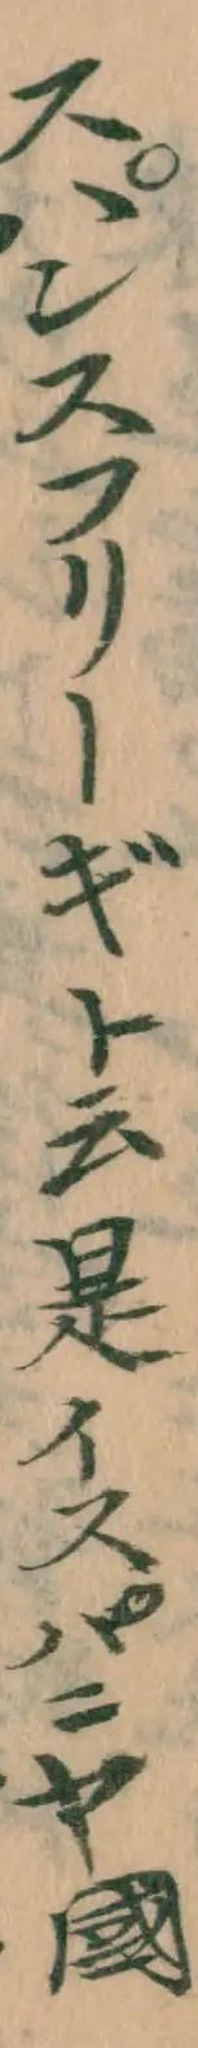スパンスフリーギト云是イスパニヤ國
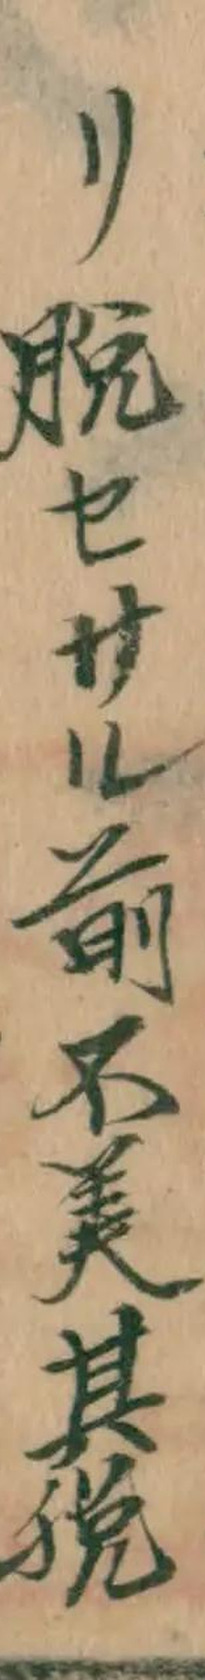リ脱セサル前不美其脱
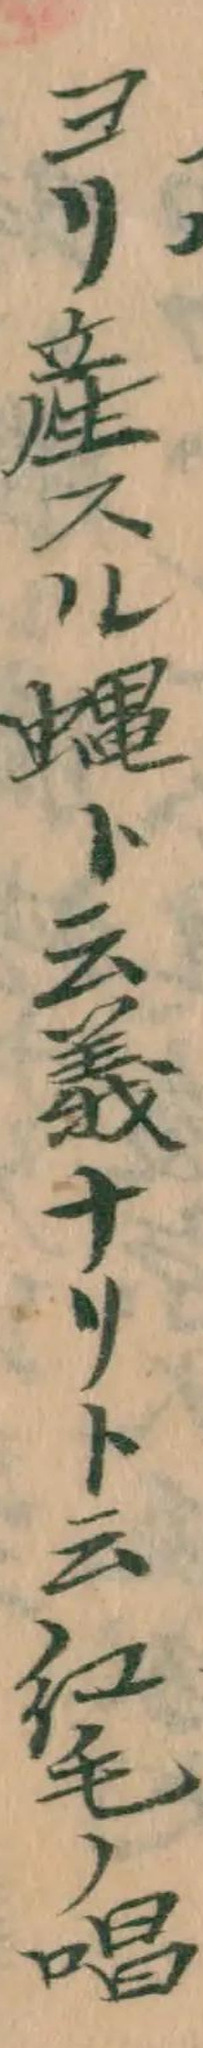ヨリ産スル蝿ト云義ナリト云紅毛ノ唱
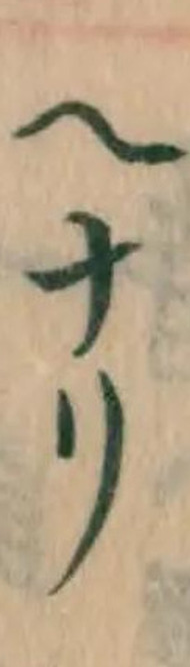ヘナリ
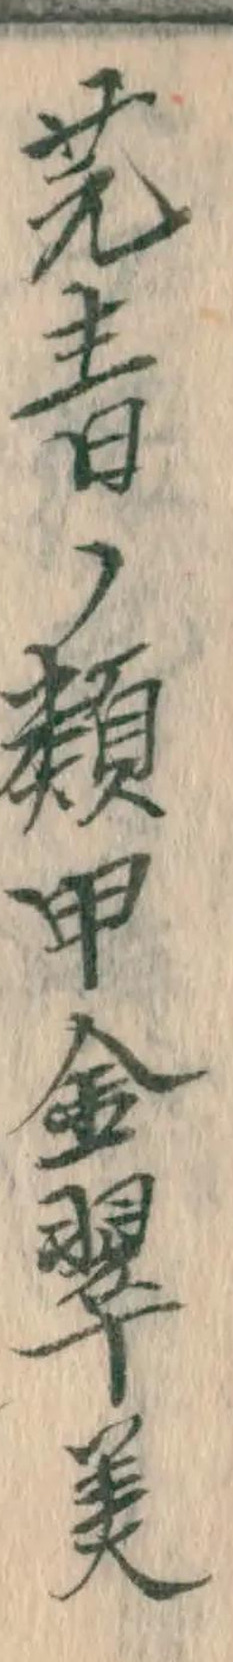芫青ノ類甲金翠美
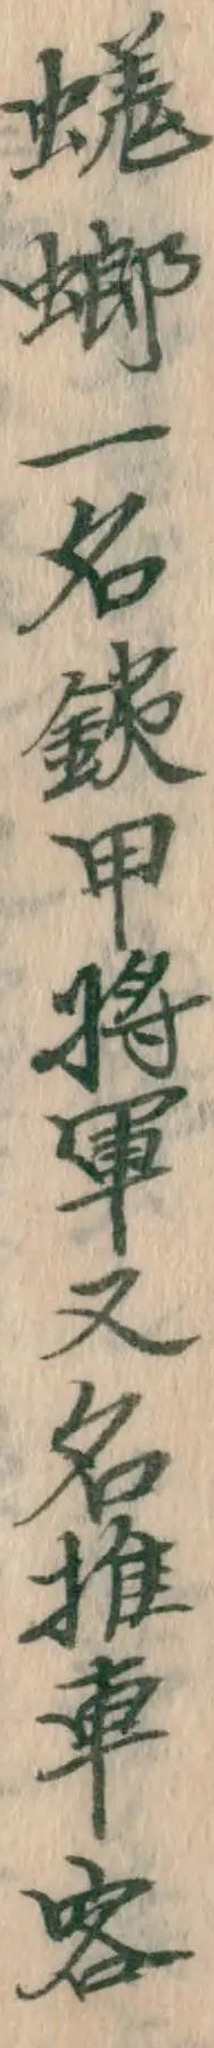蜣螂一名銕甲将軍又名推車客
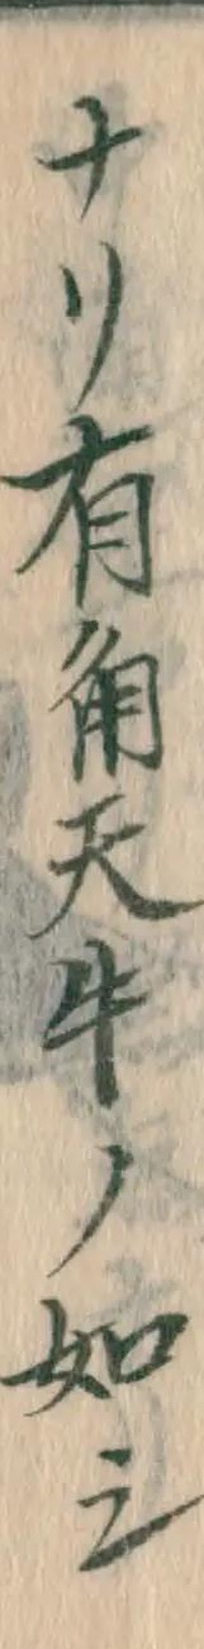ナリ有角天牛ノ如シ
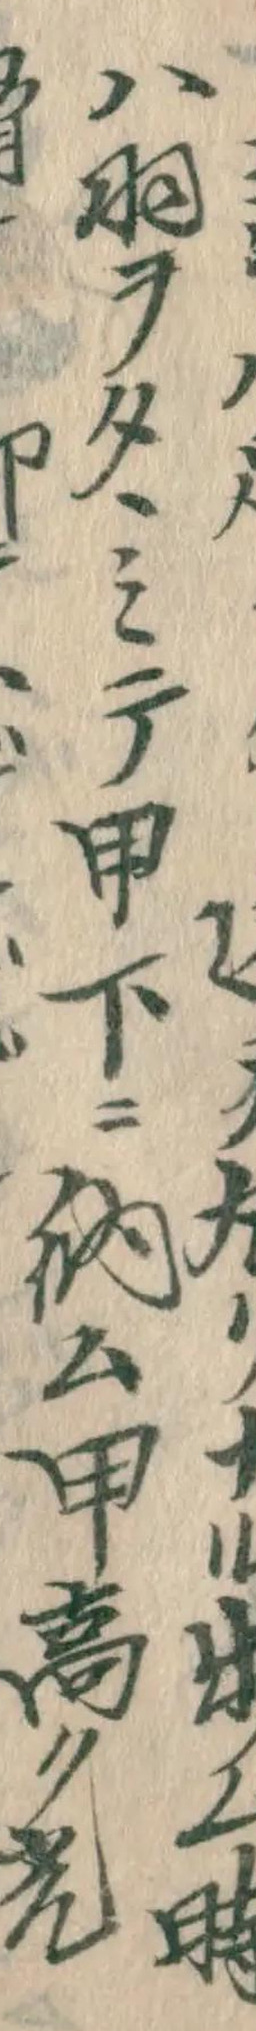ハ羽ヲタヽミテ甲下ニ納ム甲高ク光
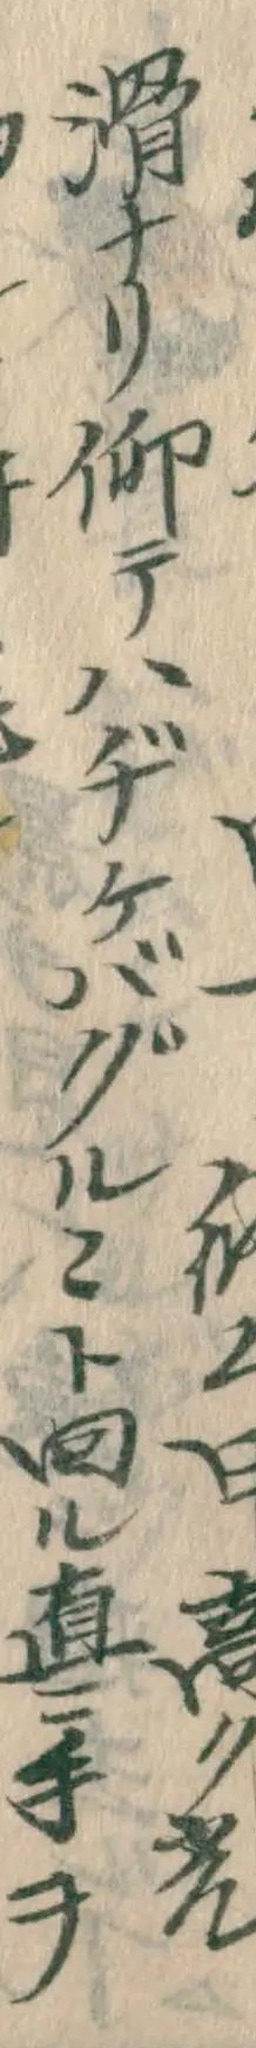滑ナリ仰テハヂケバグル々ト回ル直ニ手ヲ
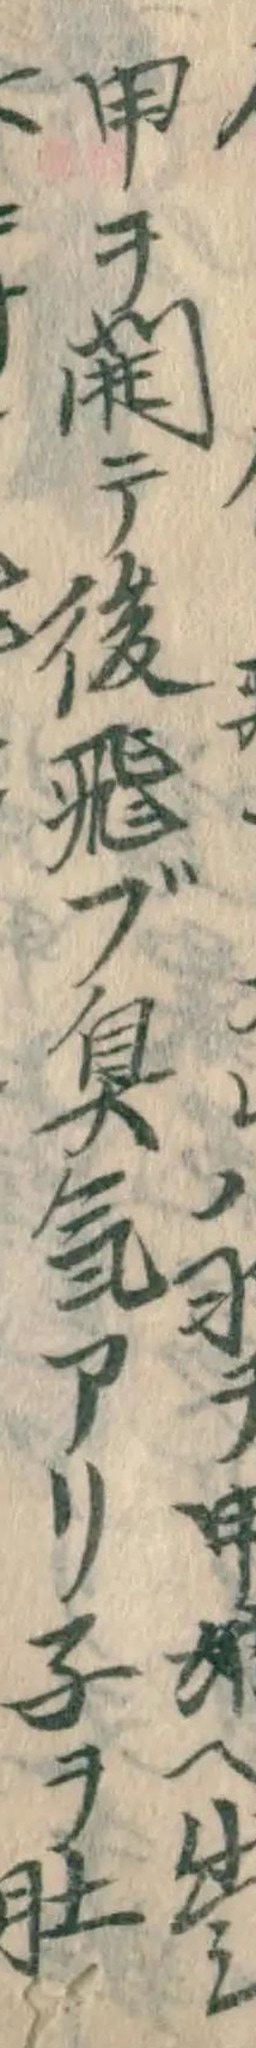甲ヲ開テ後飛ブ臭気アリ子ヲ肚
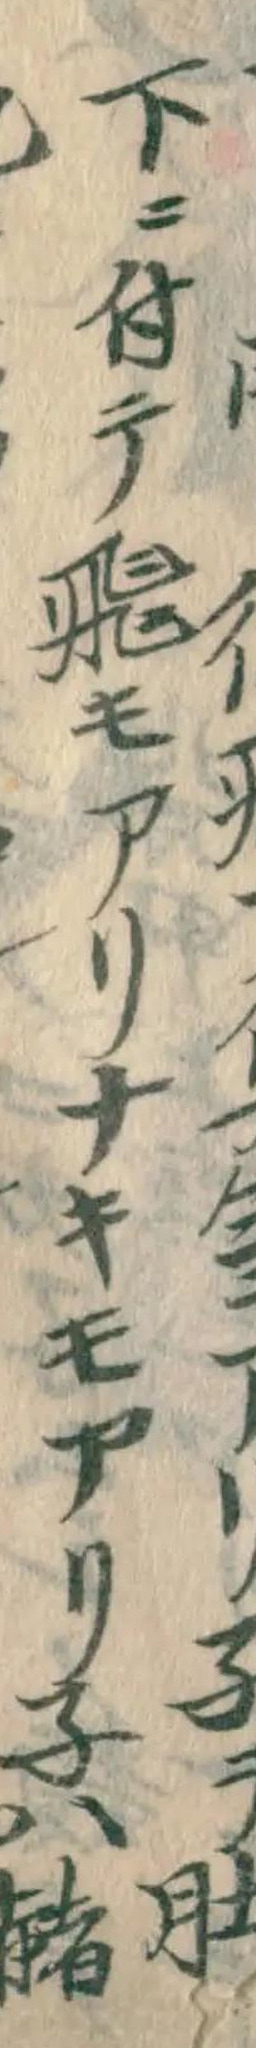下ニ付テ飛モアリナキモアリ子ハ赭
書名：千蟲譜 3巻. [2]
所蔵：国立国会図書館 National Diet Library, JAPAN
